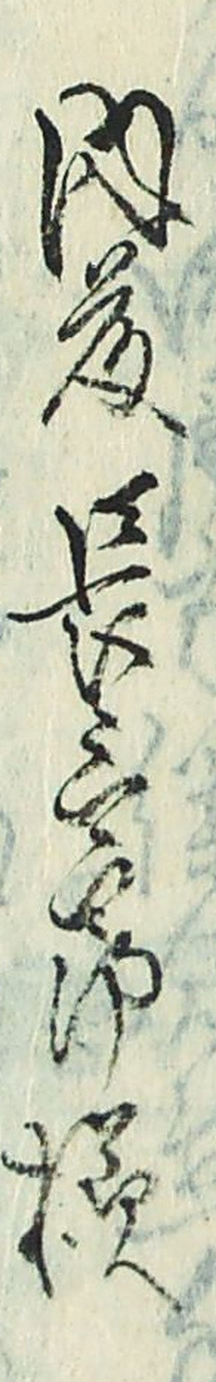内藤長三郎様
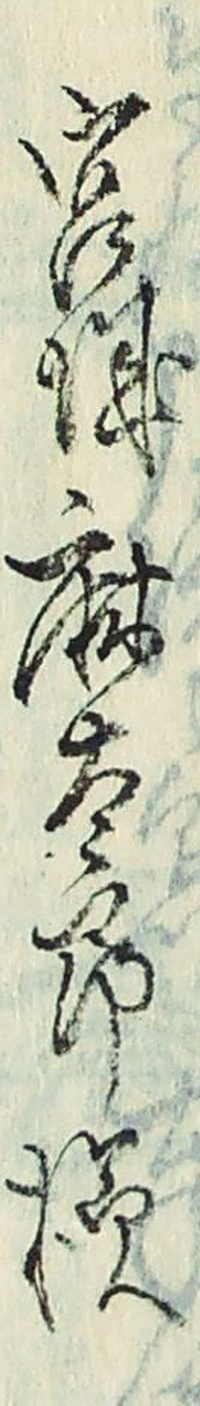宮城麻太郎様
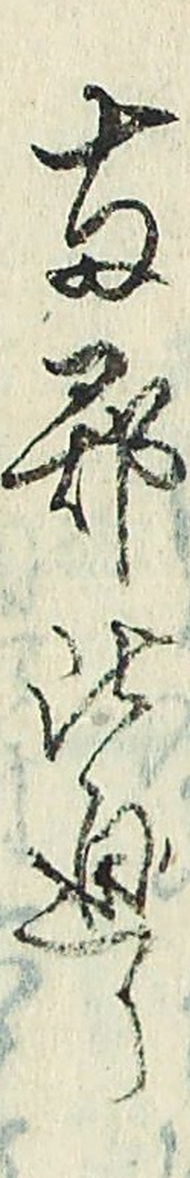両郡此通り
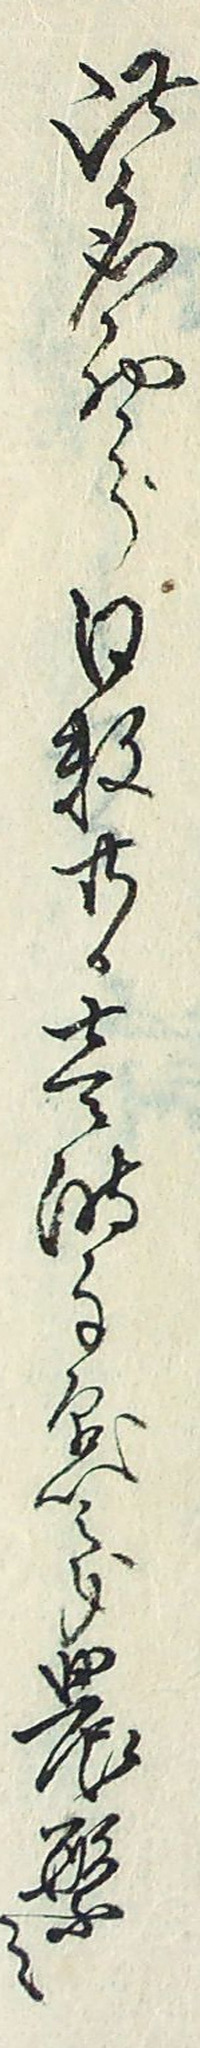此名西分日数廿日壱時手懸之義農繁之

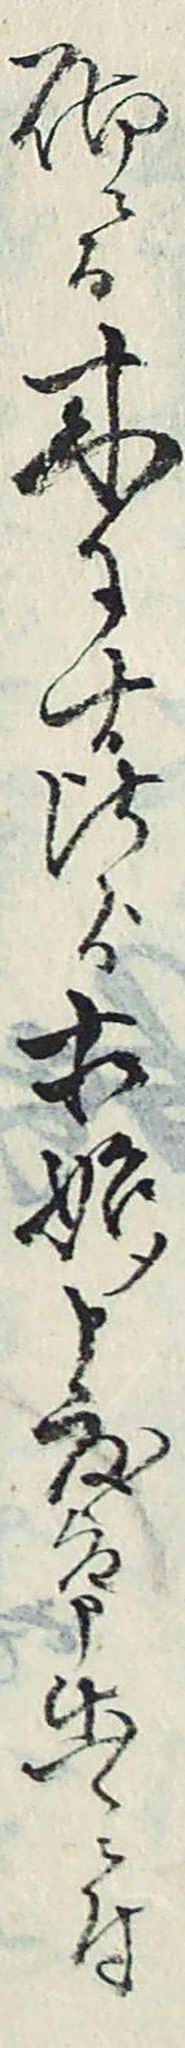砌ニ而来月十日比ゟ相始メ申度旨申出候ニ付
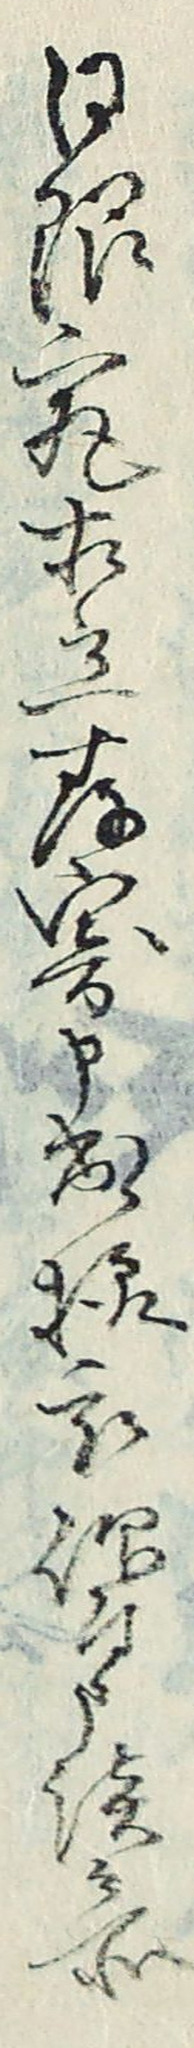日限究相立存寄申出候様被仰付申談候所
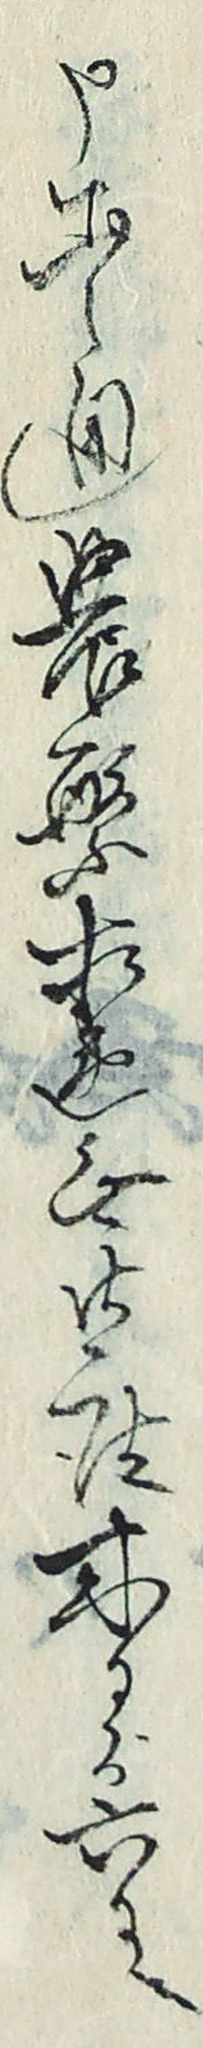申出之通農繁相違無御座来月ゟ六月へ
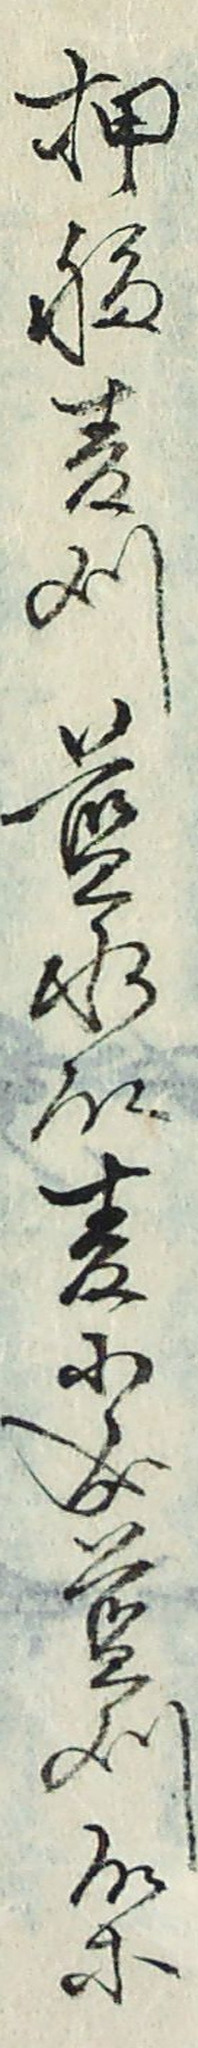押移麦刈藍水取麦小成藍刈取等
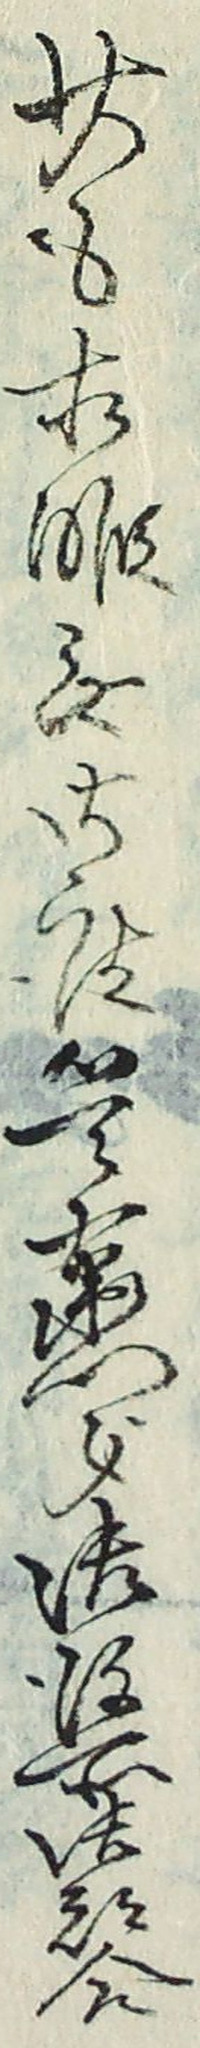少も相暇無御座兵右衛門義御役所御都合
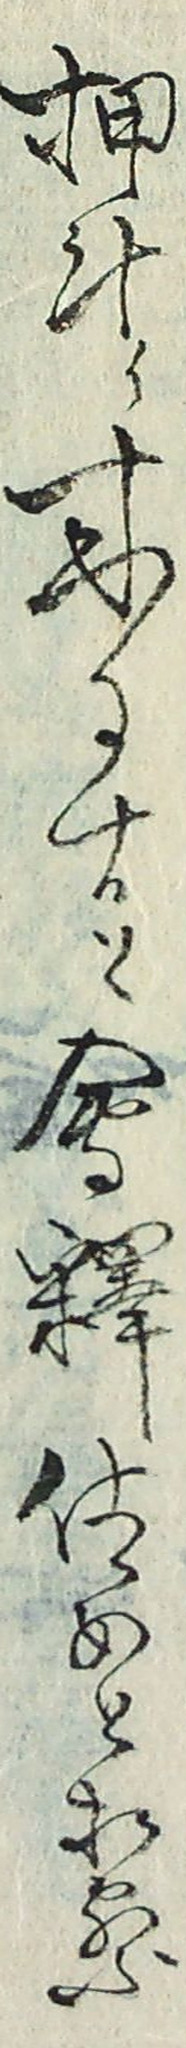押計り来月十日御會釋仕候義と相察
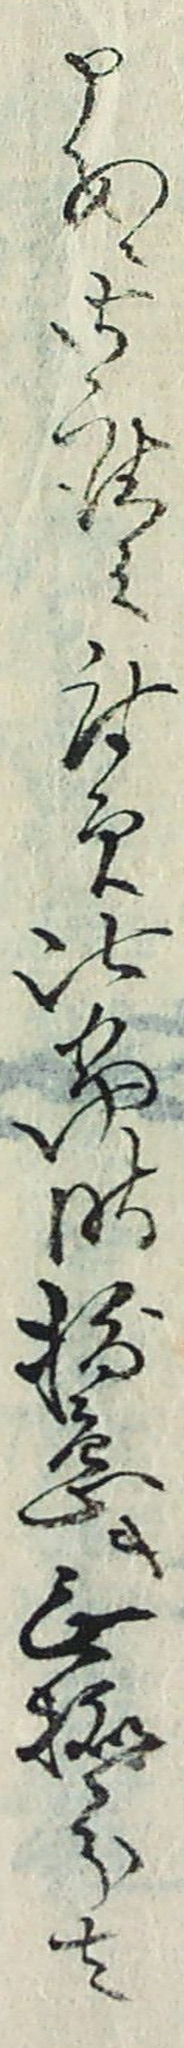申義ニ御座候付而ハ此當時指急キ無拠之分者
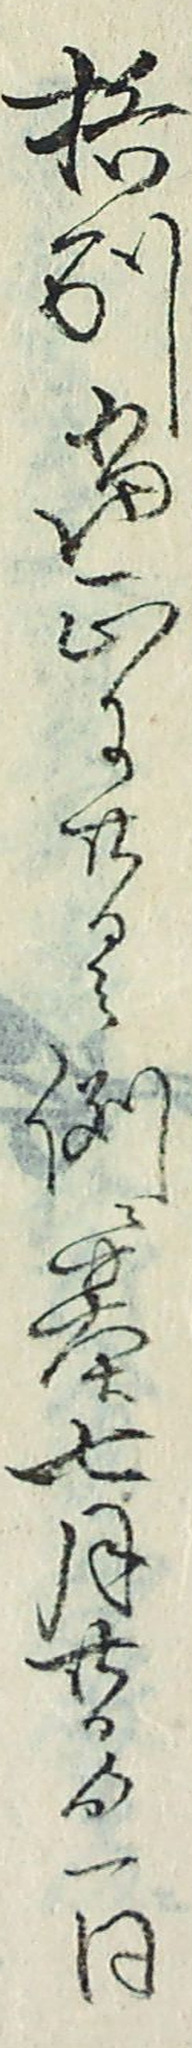格別當正月廿日之例ニ基七月廿日ゟ一同
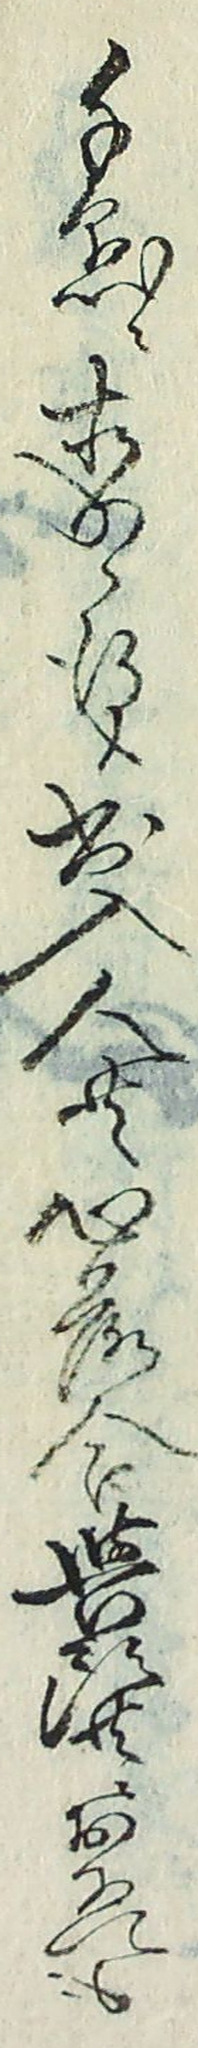手懸ニ相成候得ハ出入人共心落合與頭共ニおゐても
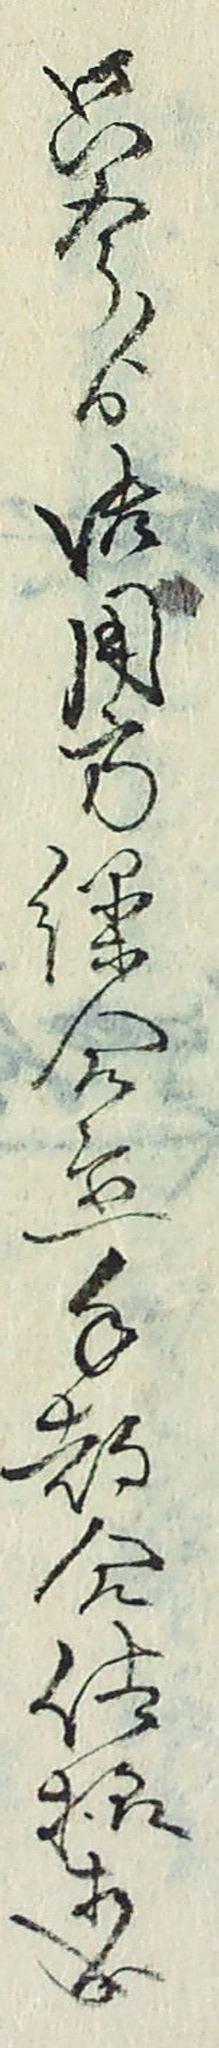只今ゟ御用方繰合置手都合仕候様相成
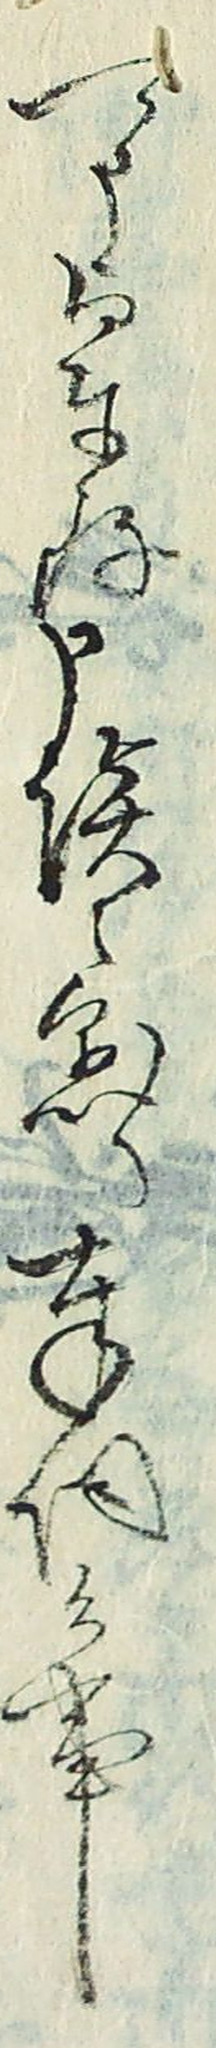可申旨奉存申談候懸り奉伺候事
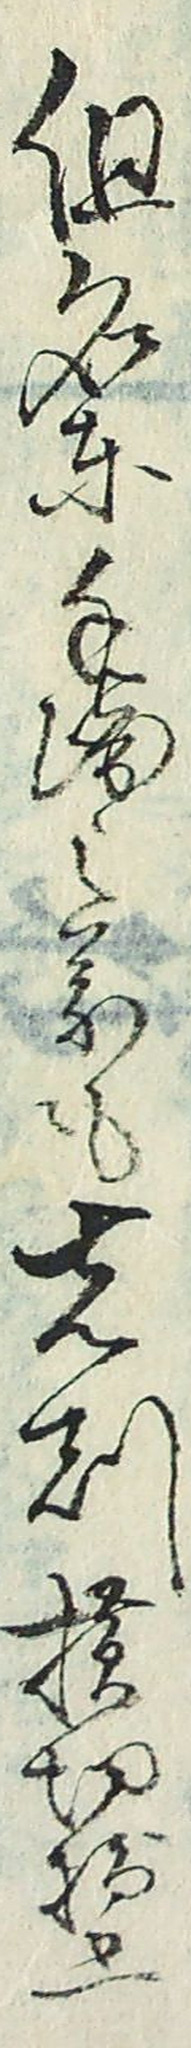但名東手崎之義も先刻横切指上
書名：諸御趣意書并御下知向之写
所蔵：鳴門教育大学 Naruto University of Education
